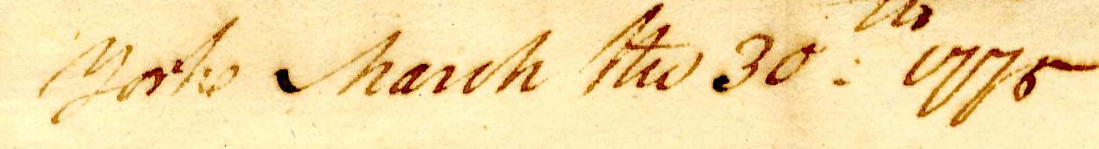York March the 30^th 1775
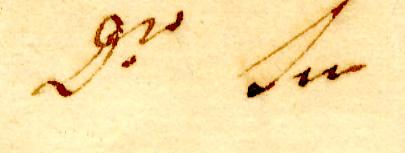D^r Sir
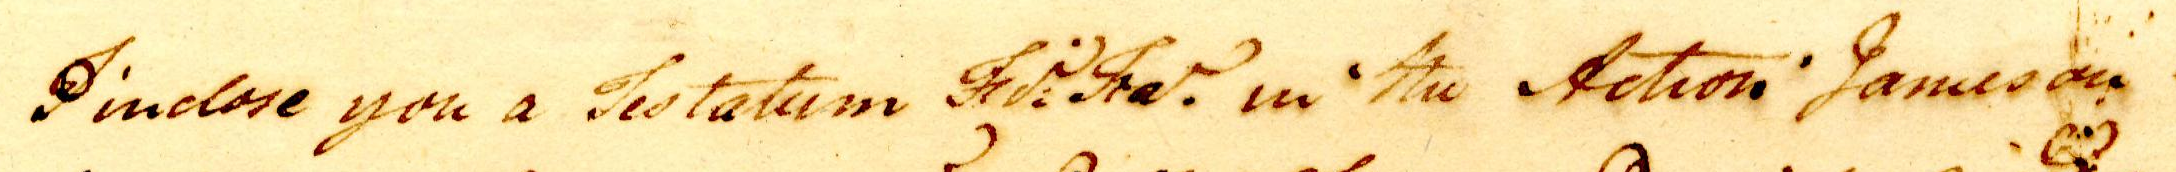I inclose you a Testatum Fed: Tra. in the Action Jameson
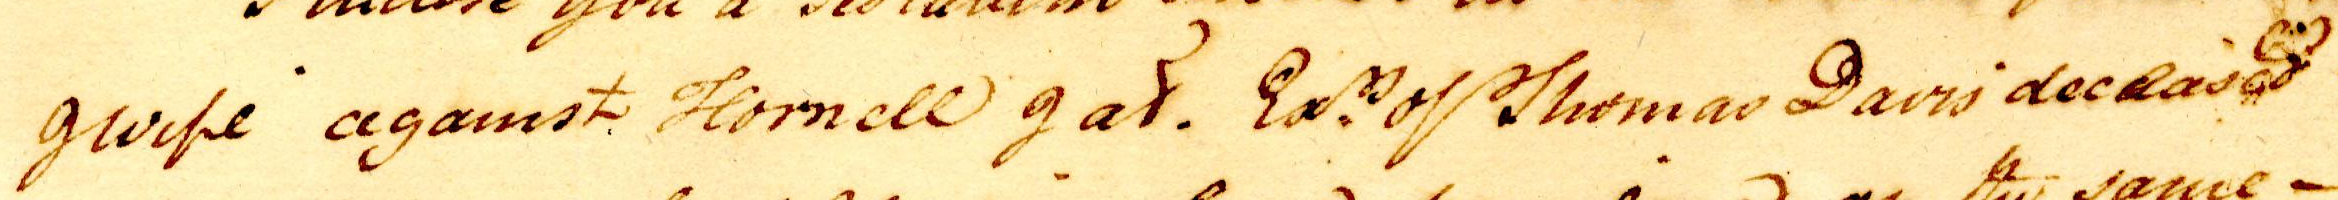& wife against Hormell & at. Ex^r. of Thomas Davis deceased
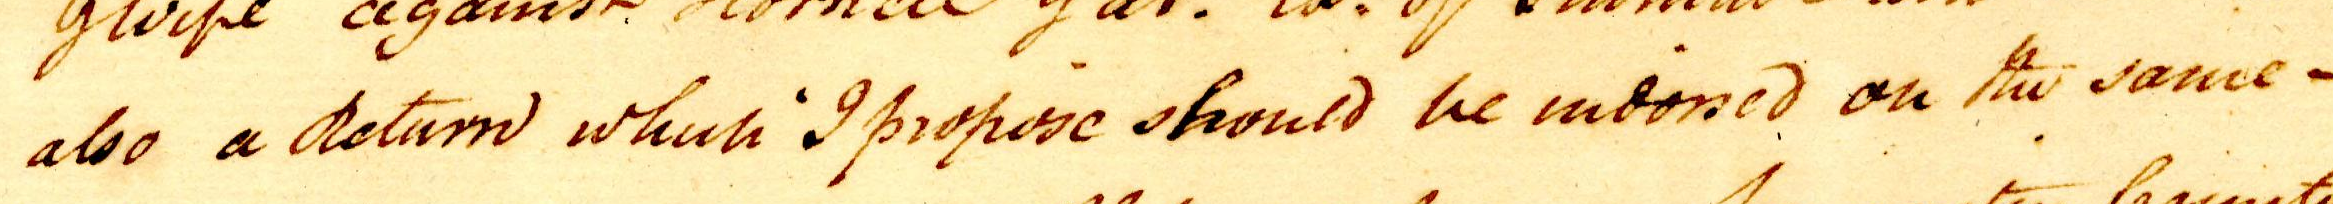also a Return which I propose should be indorsed on the same
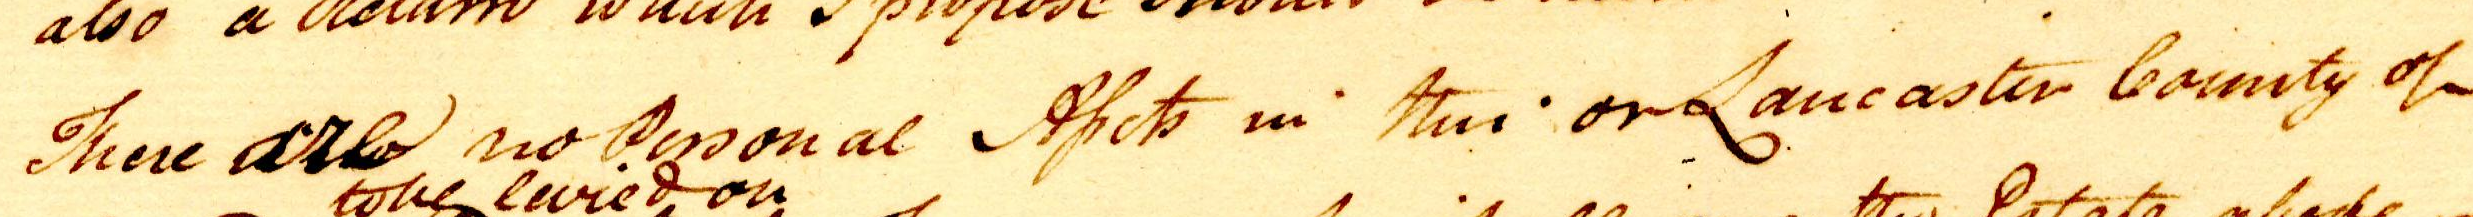There are no Personal Assets in this or Lancaster County of
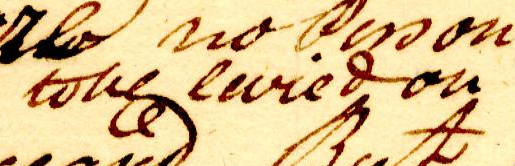to be levied on
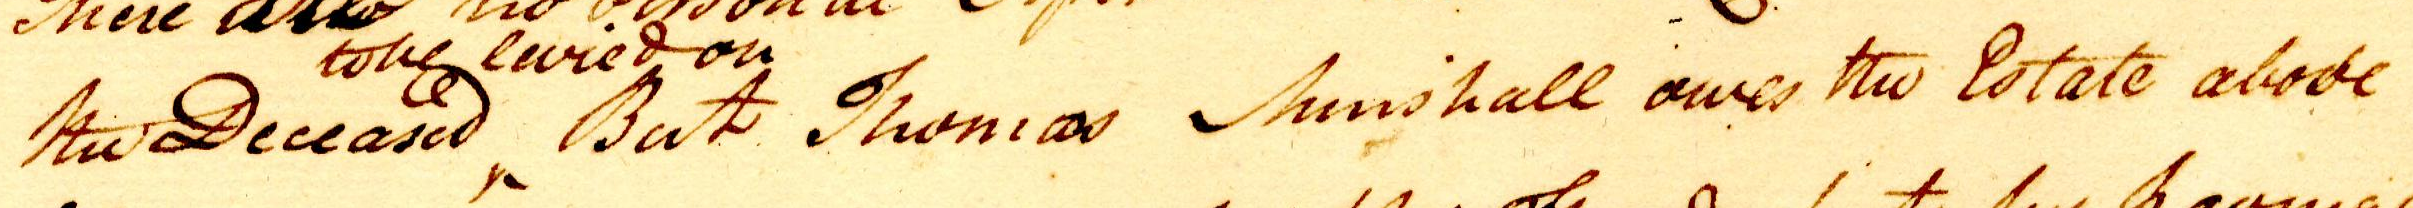the Deceased ^ But Thomas Shenshall owes the Estate about
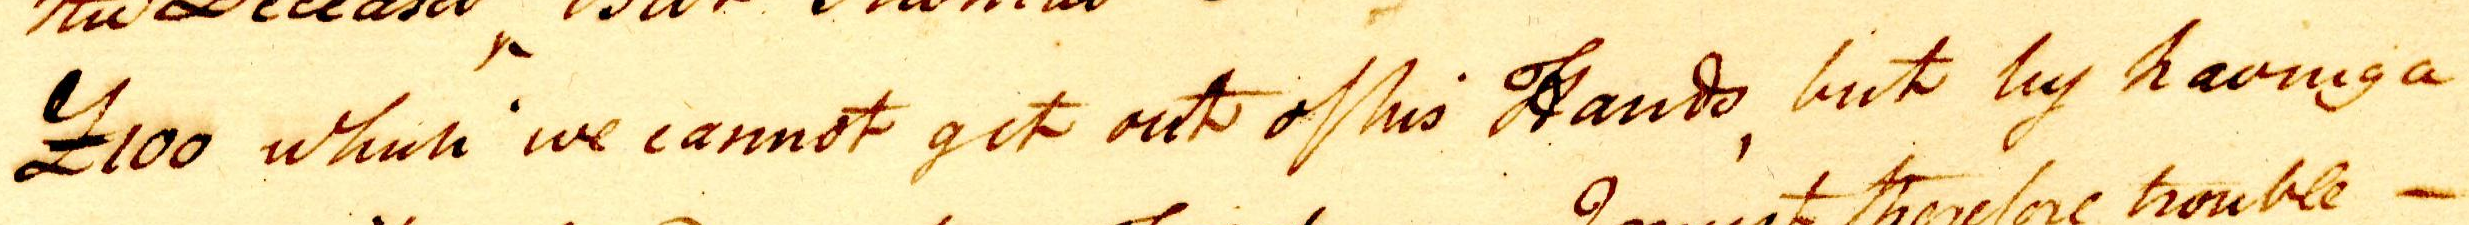£100 which we cannot get out of his Hands, but by having a
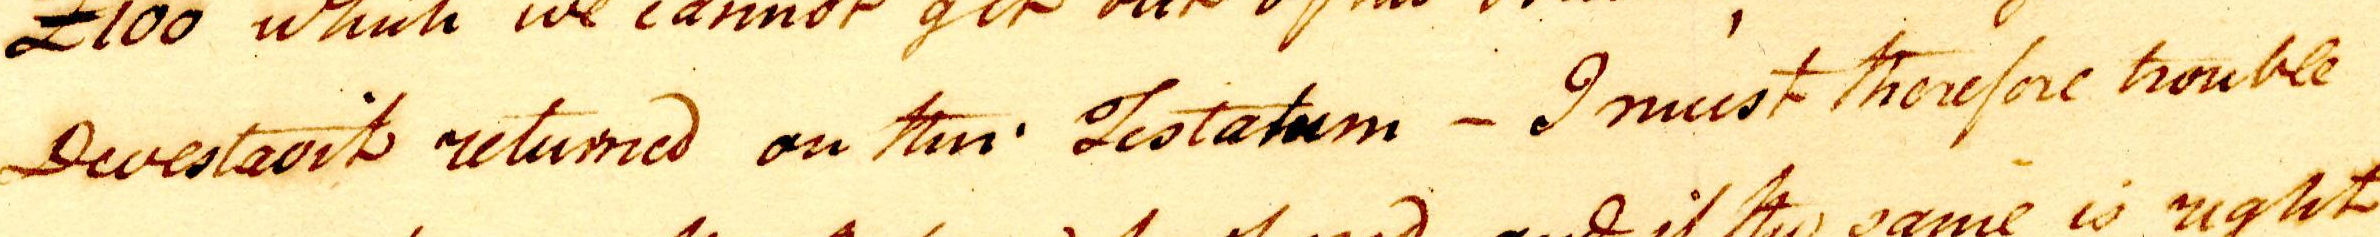Devestavit returned on their Testatum. I must therefore trouble
